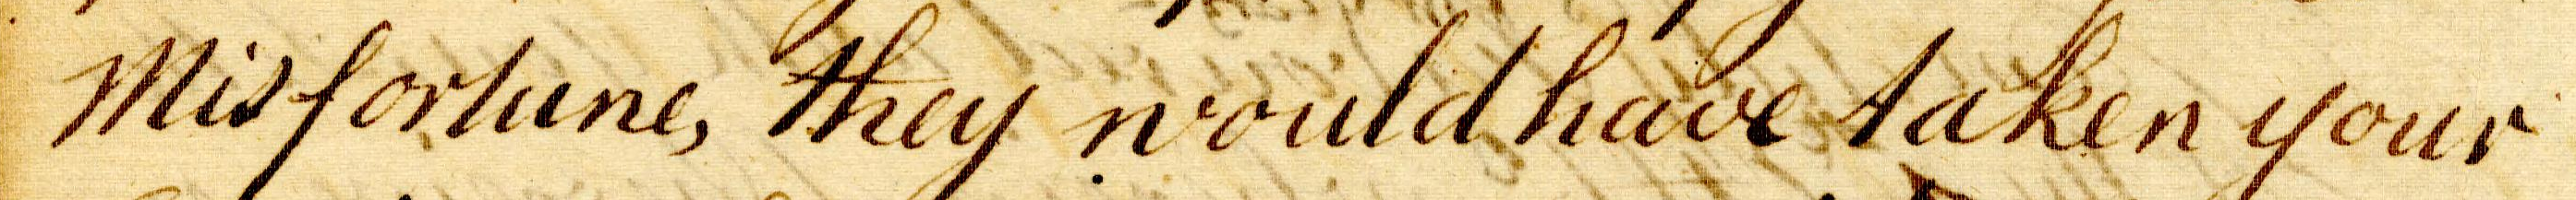Misfortune, they would have taken Your
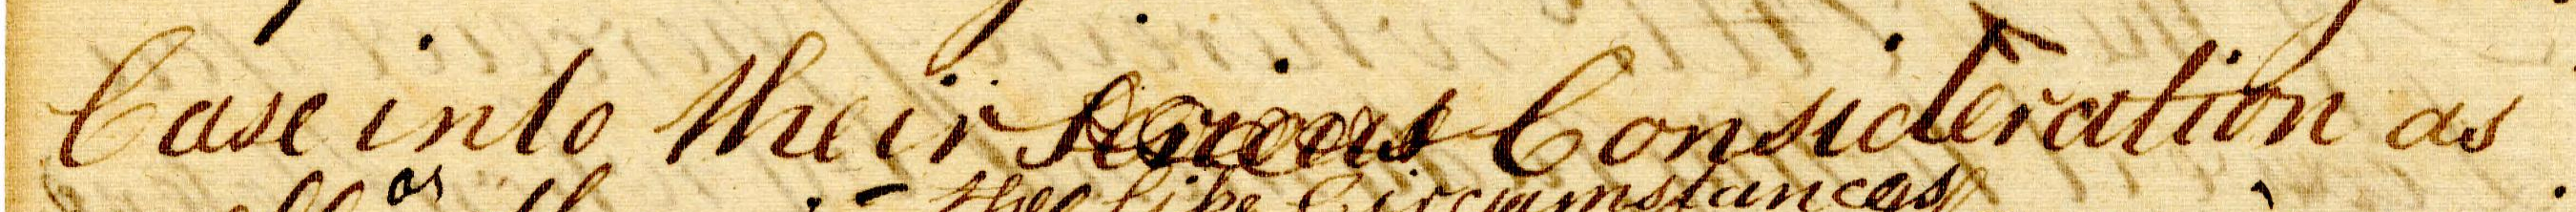Case into their [______] Consideration as
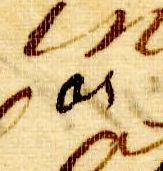as
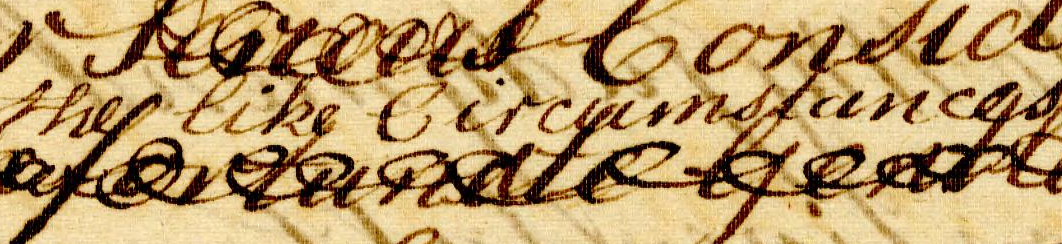the like Circumstances
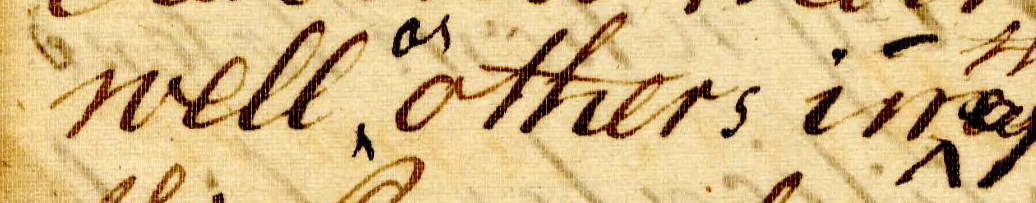well, others in ^
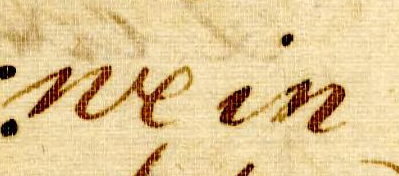we in
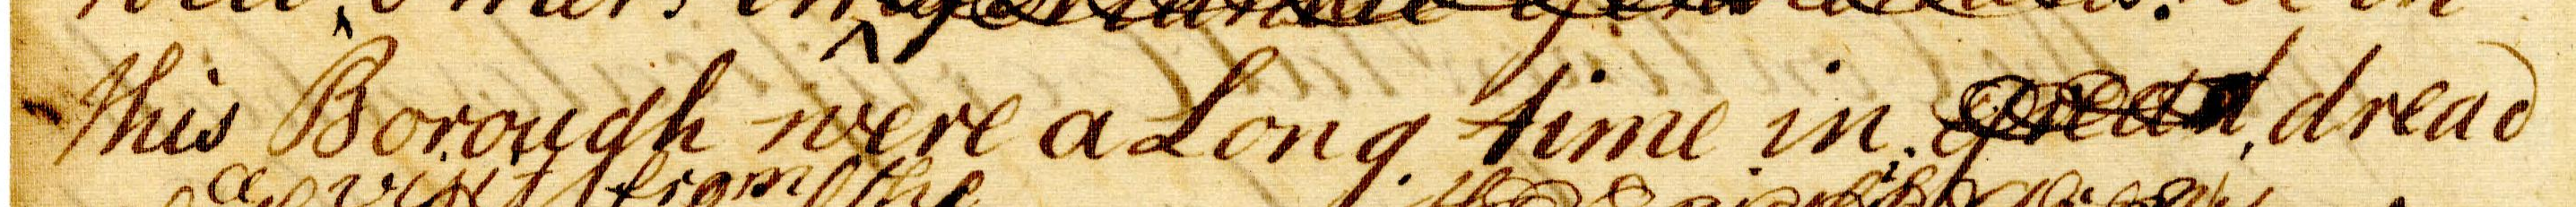this Borough were a Long time in [great] dread
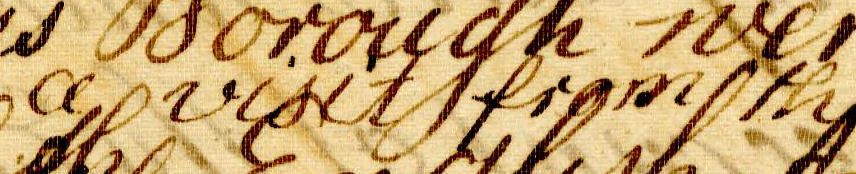a visit from the
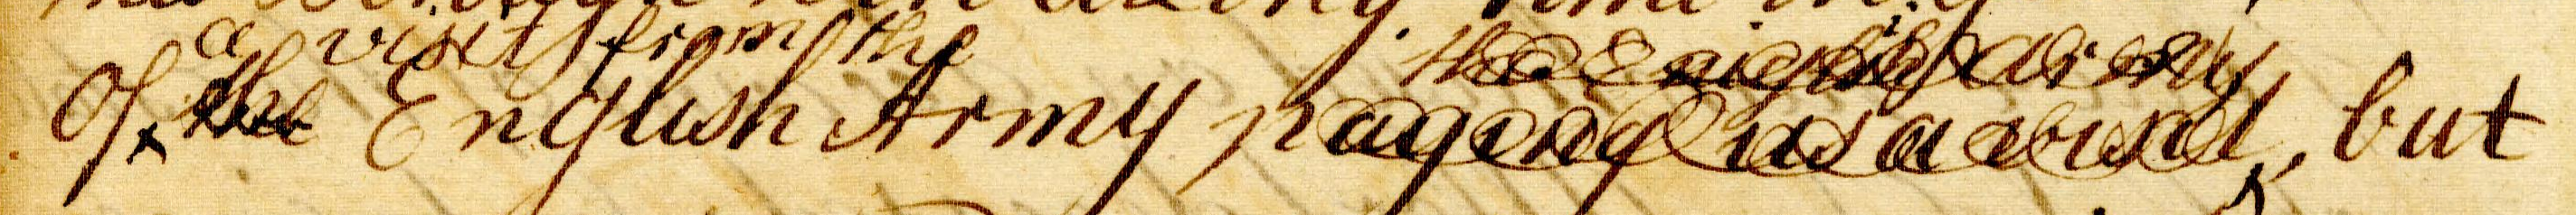Of ^ [the] English Army [paying us a visit,] but
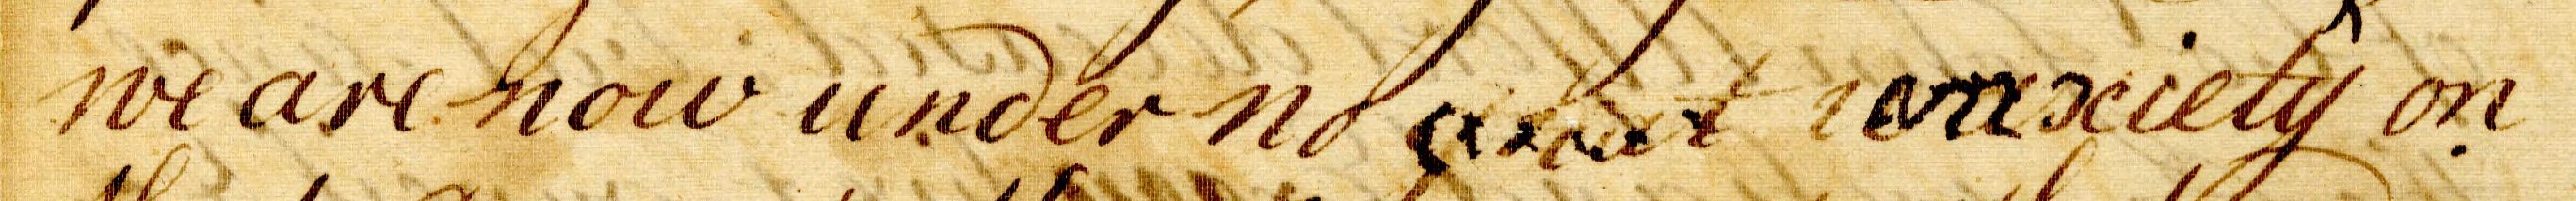we are now under no great anxiety on
